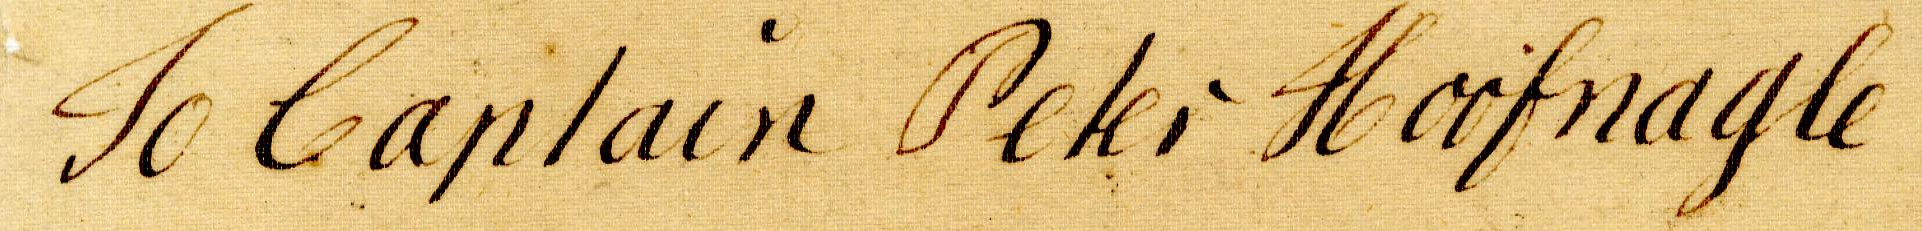To Captain Peter Hoofnagle
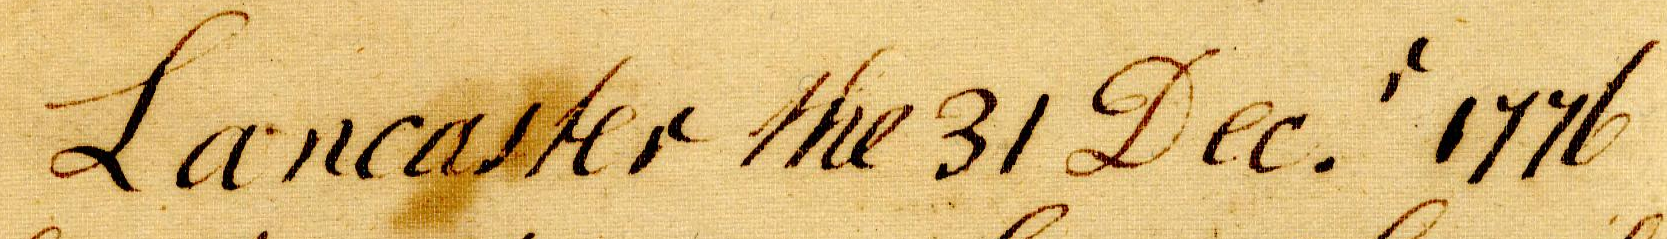Lancaster the 31 Dec.^r 1776
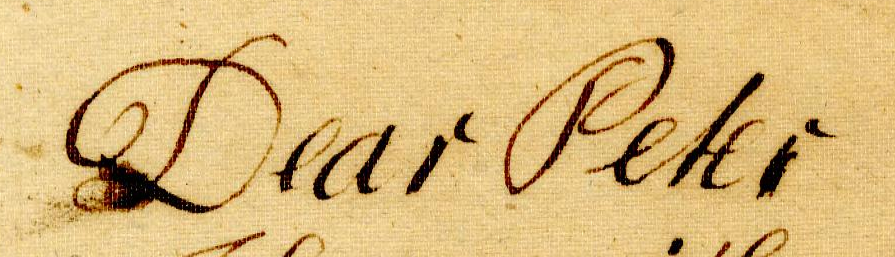Dear Peter
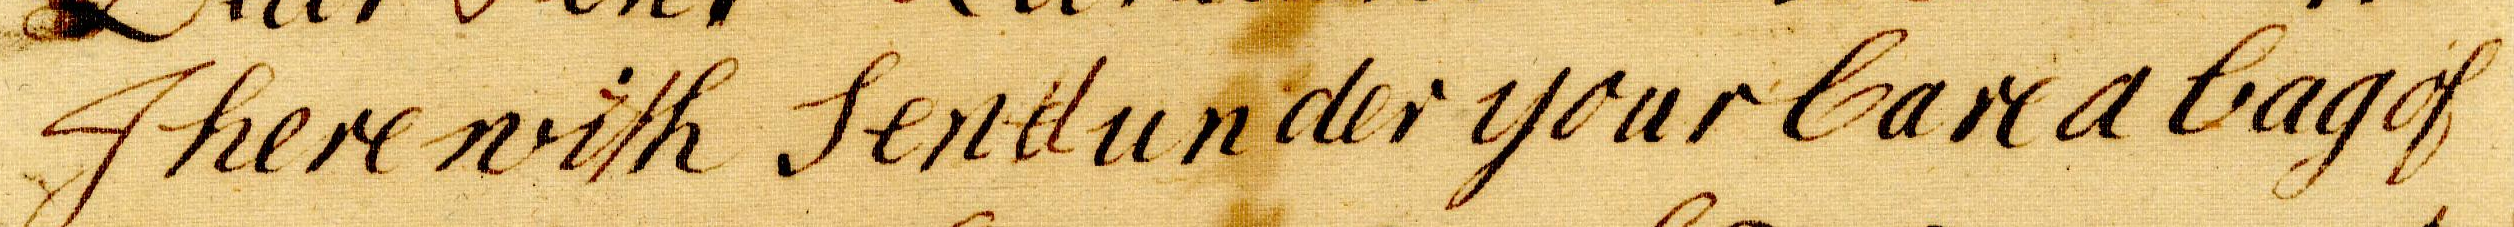I here with Send under Your Care a bag of
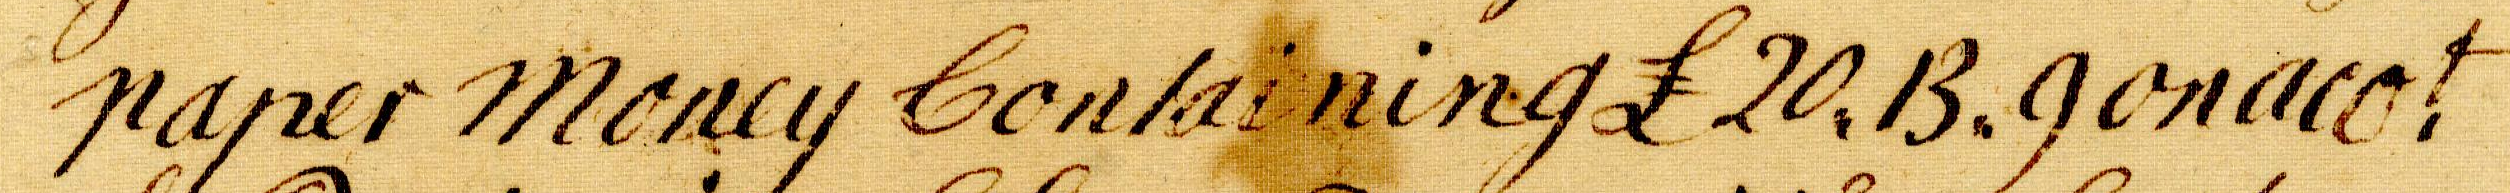paper Money Containing £20..13..9 on aco^t.
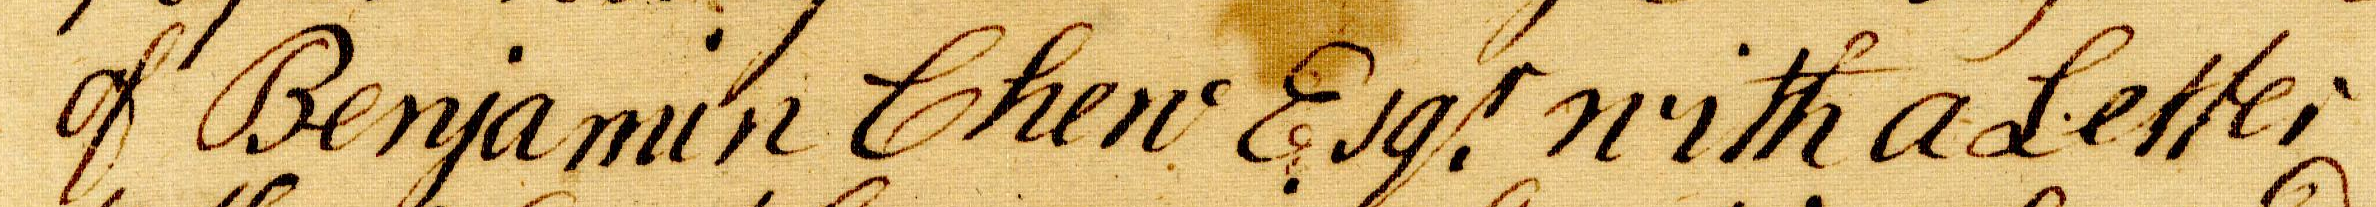of Benjamin Chew Esq^r. with a Letter
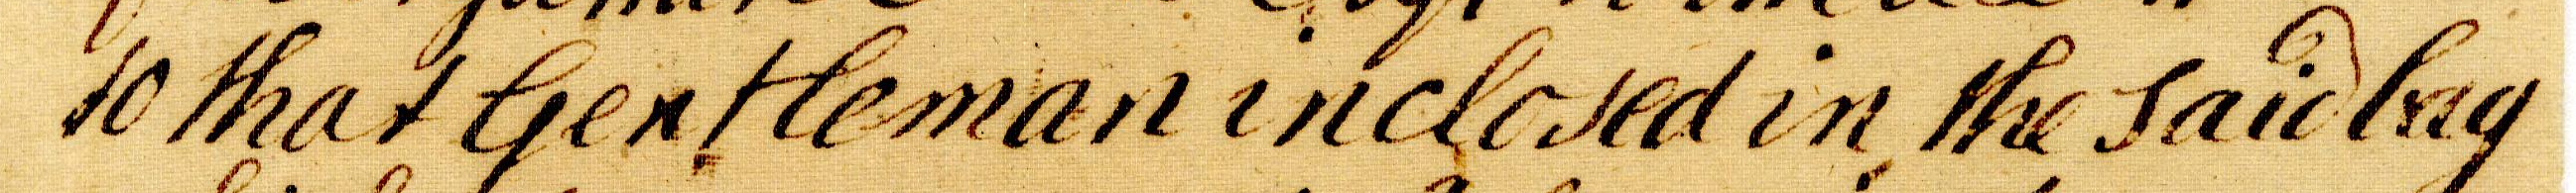so that Gentleman inclosed in the said bag
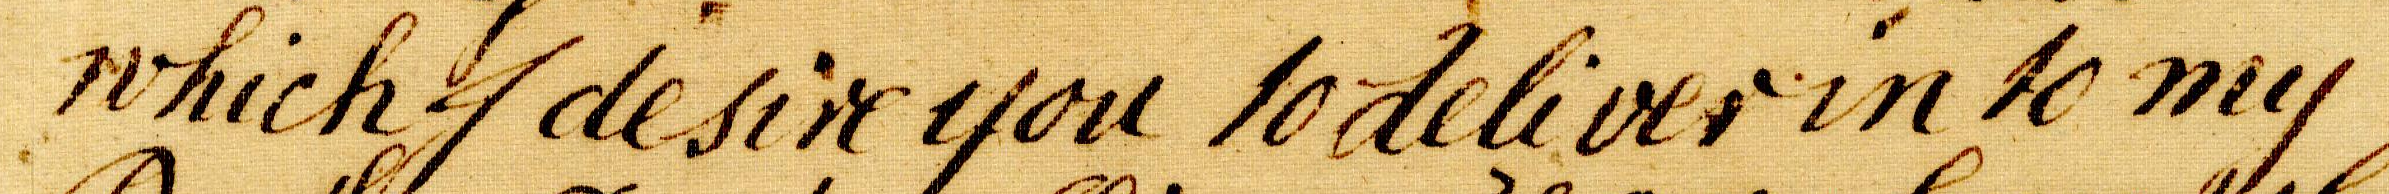which I desire you to deliver in to my
